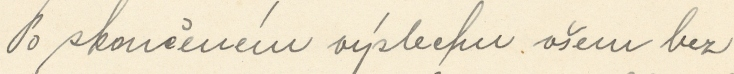Po skončeném výslechu všem bez
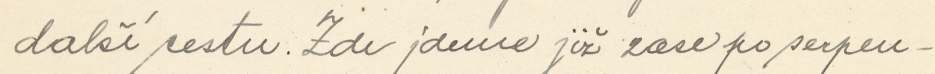další cestu. Zde jdeme již zase po serpen-
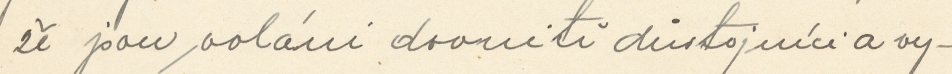že jsou voláni dovnitř důstojníci a vy-
